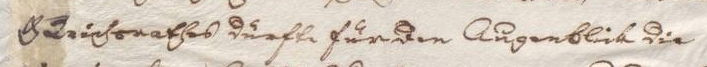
& Reichsrathes dürfte für den Augenblick die
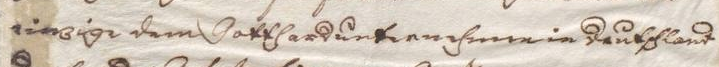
einzige dem Gotthardunternehmen in Deutschland
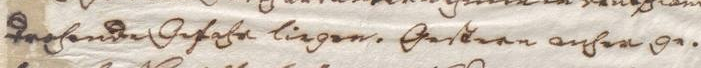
drohende Gefahr liegen. Gestern anher ge-
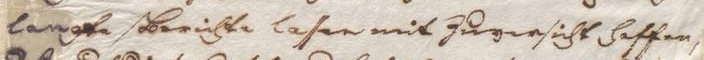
langte Berichte lassen mit Zuversicht hoffen,
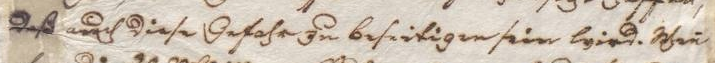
daß auch diese Gefahr zu beseitigen sein wird. Wenn
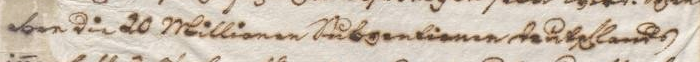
aber die 20 Millionen Subventionen Deutschlands
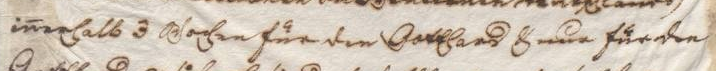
innerhalb 3 Wochen für den Gotthard & nur für den
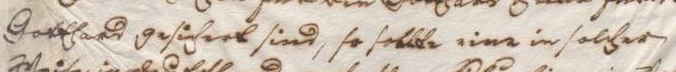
Gotthard gesichert sind, so sollte eine in solcher
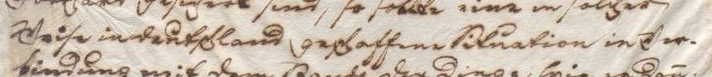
Weise in Deutschland geschaffene Situation in Ver-
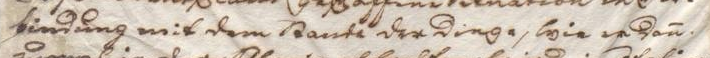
bindung mit dem Stande der Dinge, wie er dann-
